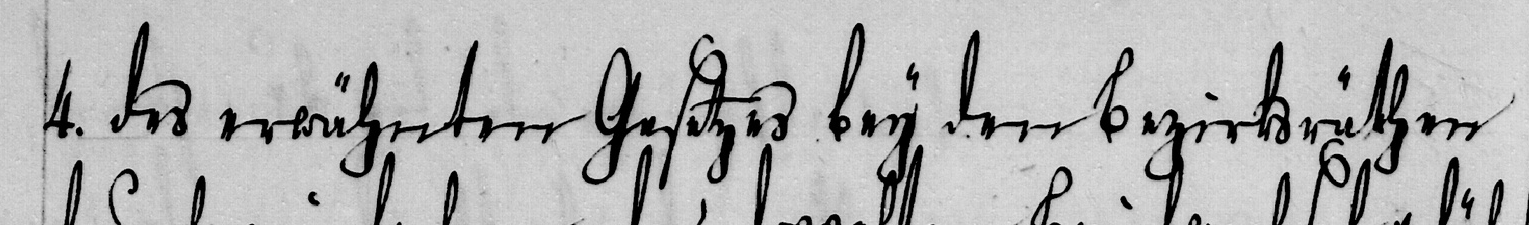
4. des erwähnten Gesetzes bey den Bezirksräthen
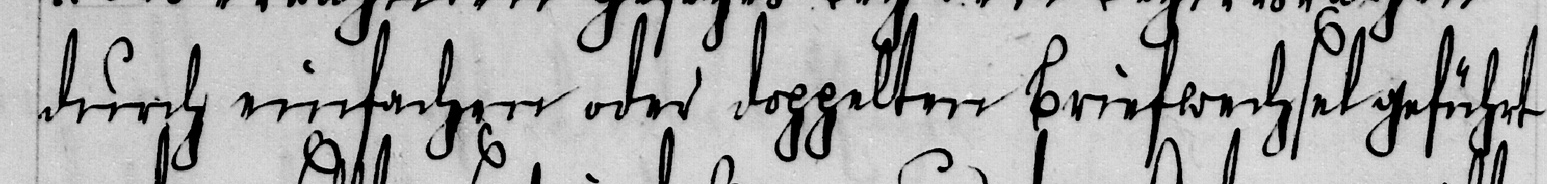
durch einfachen oder doppelten Briefwechsel geführt
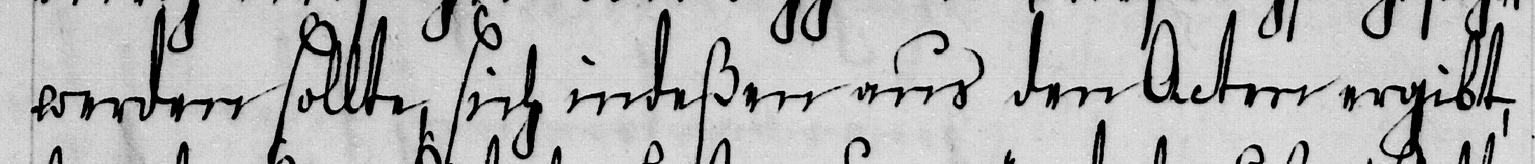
werden sollte, sich indeßen aus den Acten ergibt,
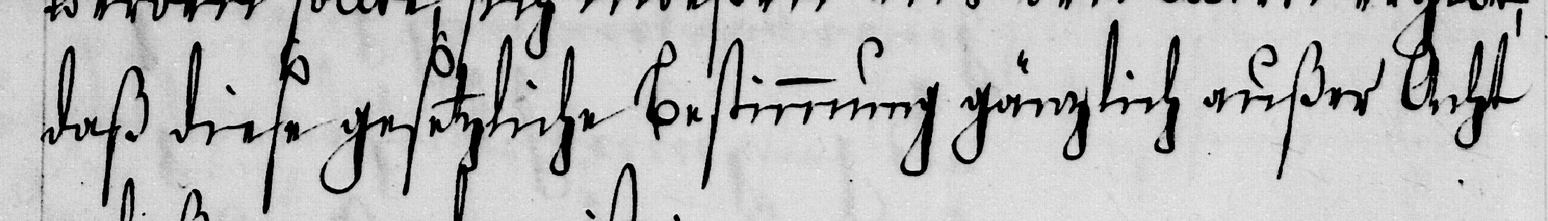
daß diese gesetzliche Bestimmung gänzlich außer Acht
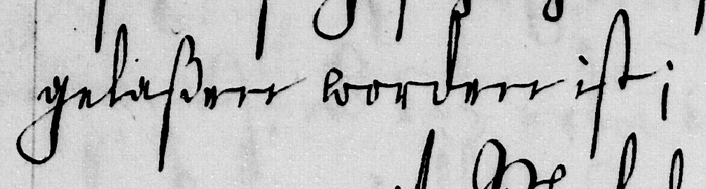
gelaßen worden ist;
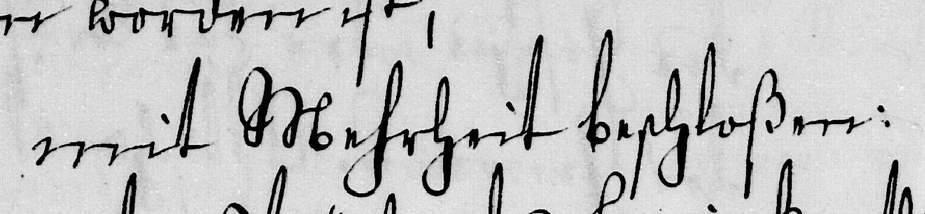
mit Mehrheit beschloßen:
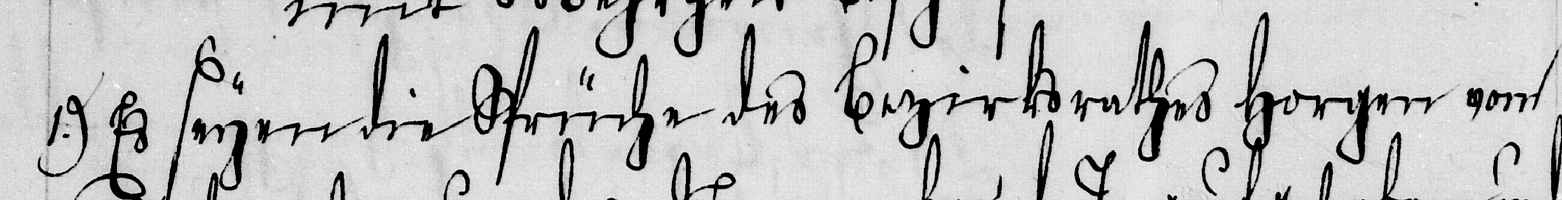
1.) Es seyen die Sprüche des Bezirksrathes Horgen von
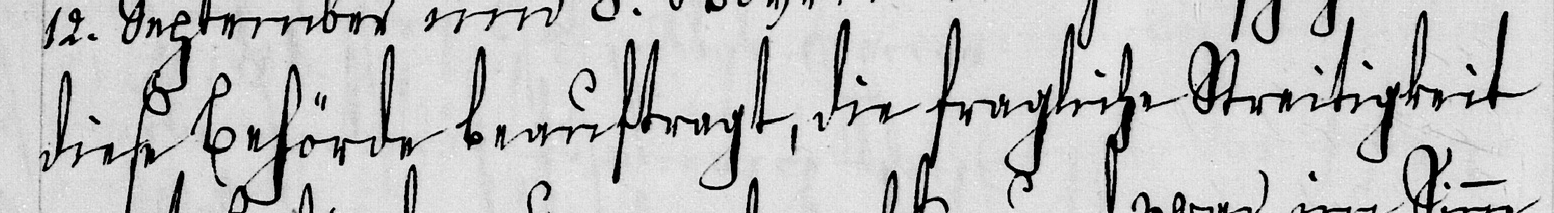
diese Behörde beauftragt, die fragliche Streitigkeit
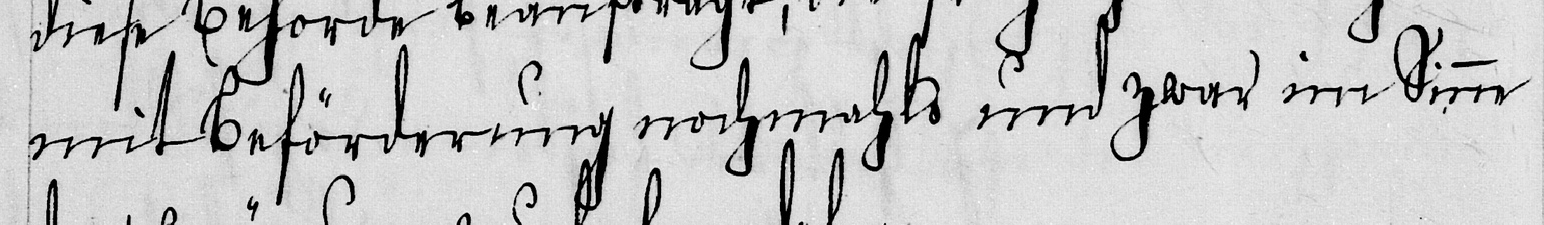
mit Beförderung nochmahls und zwar im Sinne
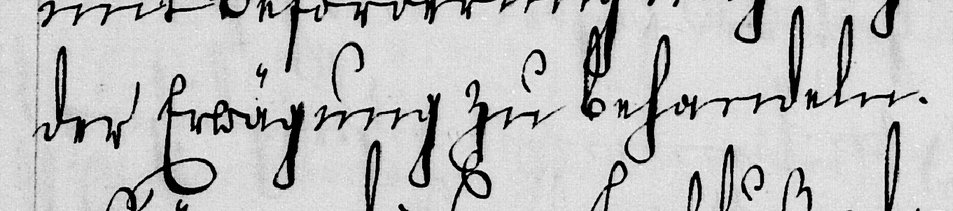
der Erwägung zu behandeln.
